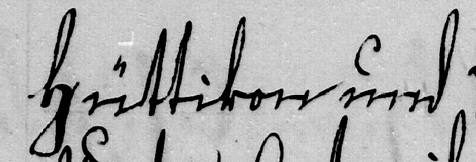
Hüttikon und
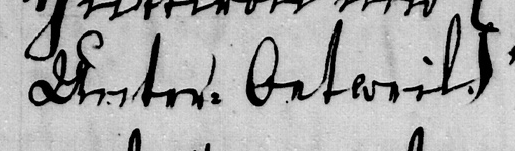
Unter-Oetweil
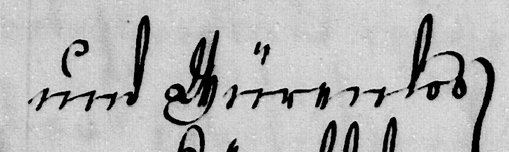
und Würenlos
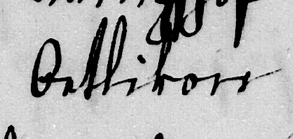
Oetlikon
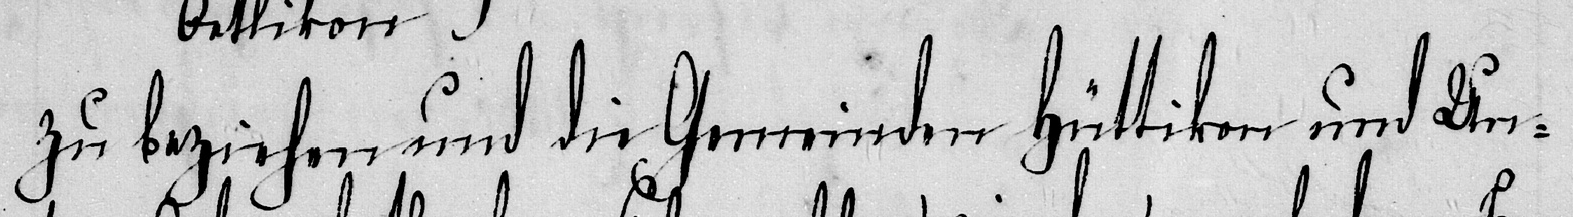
Zu beziehen und die Gemeinden Hüttikon und Un¬
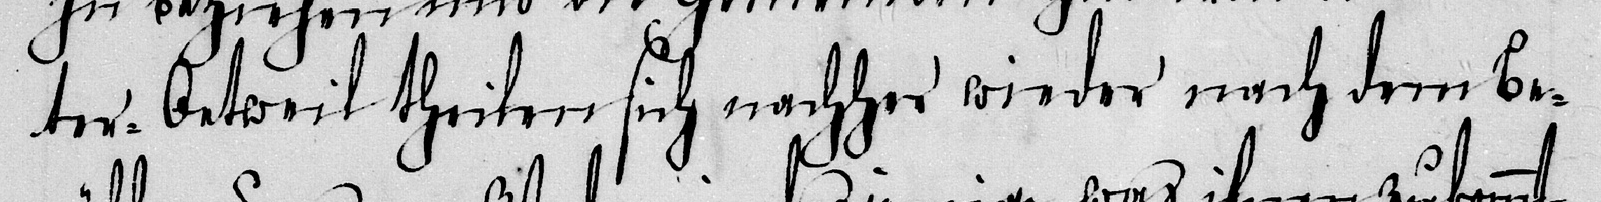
ter-Oetweil theilen sich nachher wieder nach dem Be¬
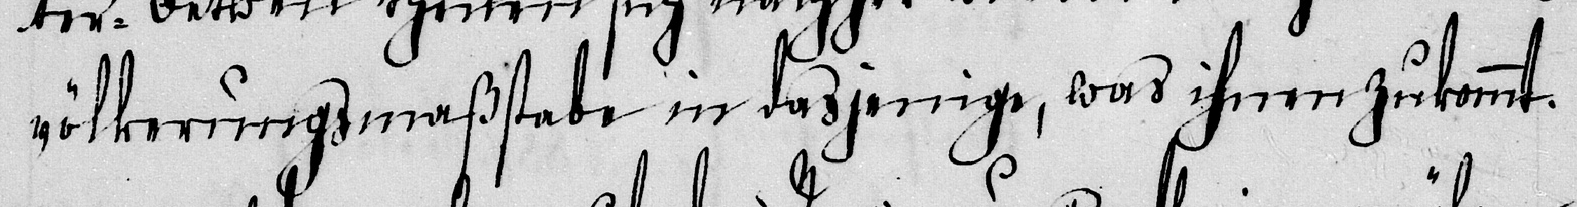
völkerungsmaßstabe in dasjenige, was ihnen zukommt.
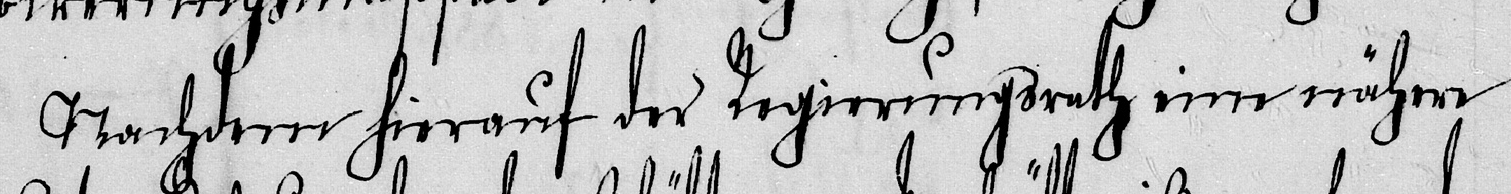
Nachdem hierauf der Regierungsrath eine nähere
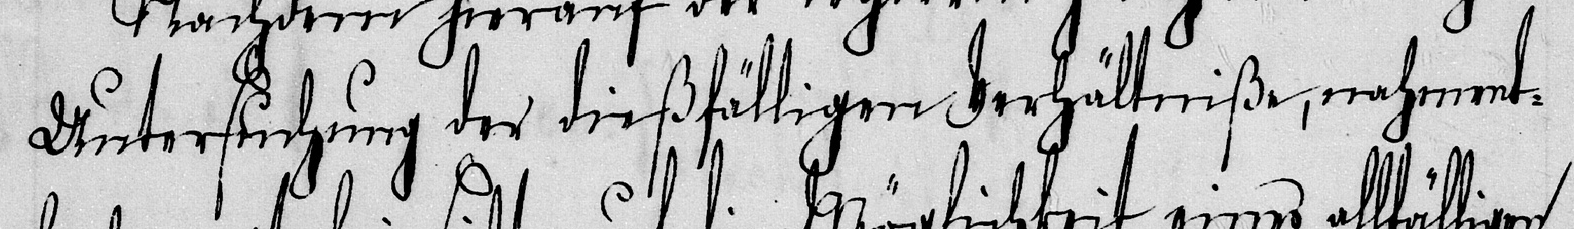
Untersuchung der dießfälligen Verhältniße, nahment¬
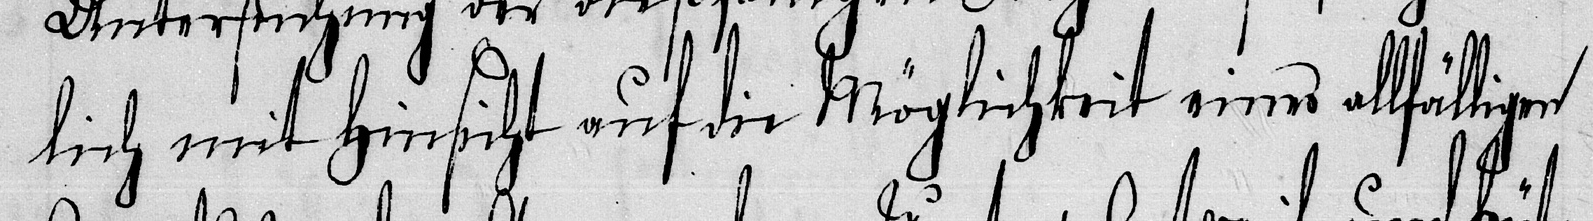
lich mit Hinsicht auf die Möglichkeit eines allfälligen
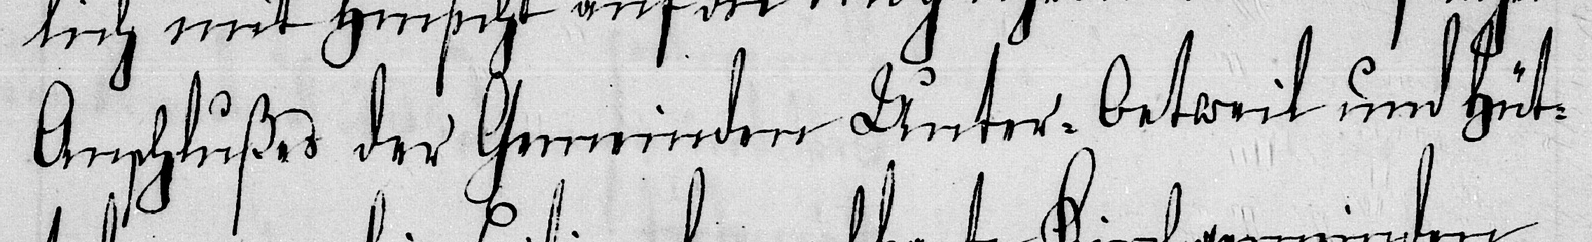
Anschlußes der Gemeinden Unter-Oetweil und Hüt¬
